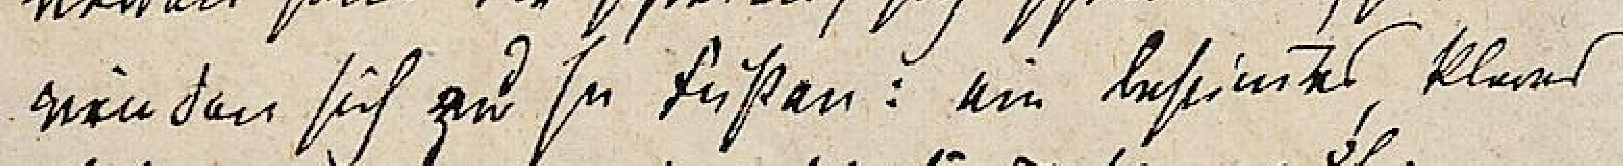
winden sich zu sn Füßen: ein bestimtes klares
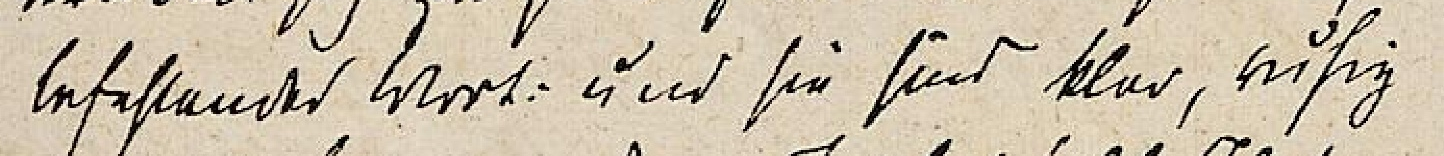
behelendes Wort: und sie sind klar, ruhig
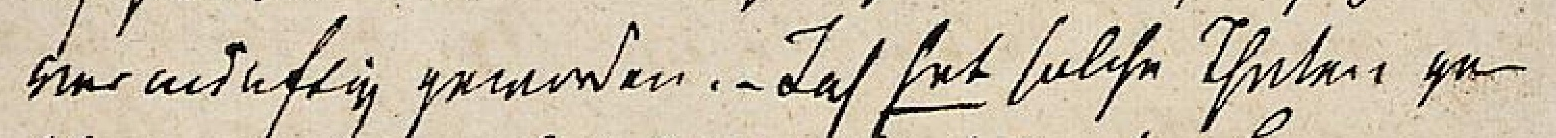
vernünftig geworden. _ Jes hat solchte Thaten ge¬
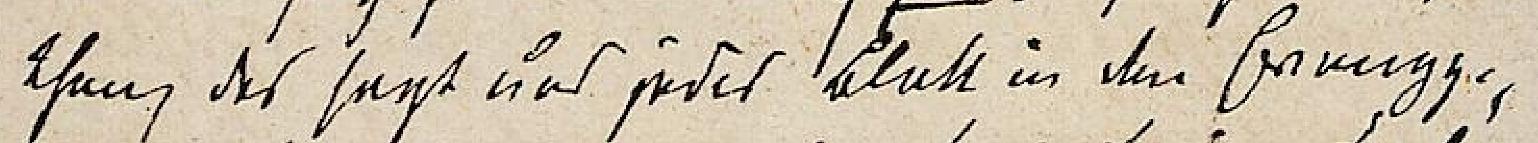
than, das sagt uns jedes Blatt in den Evangg.,
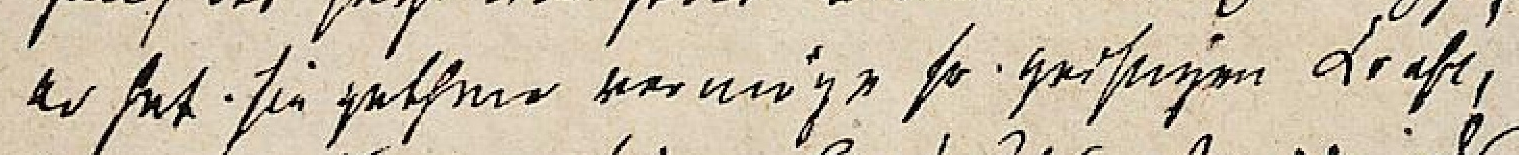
er hat sie gethan vermöge sr geistigen Kraft,
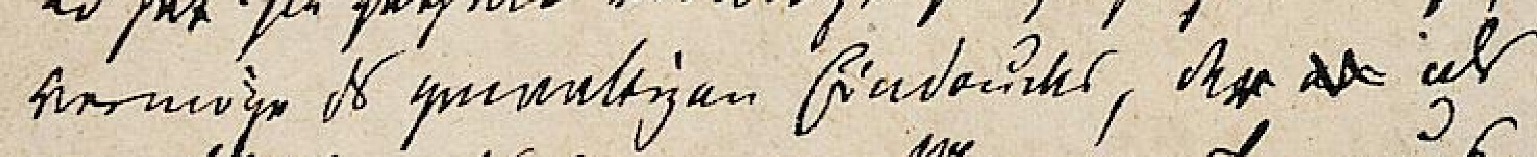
vermöge ds gewaltigen Eindrucks, der er als
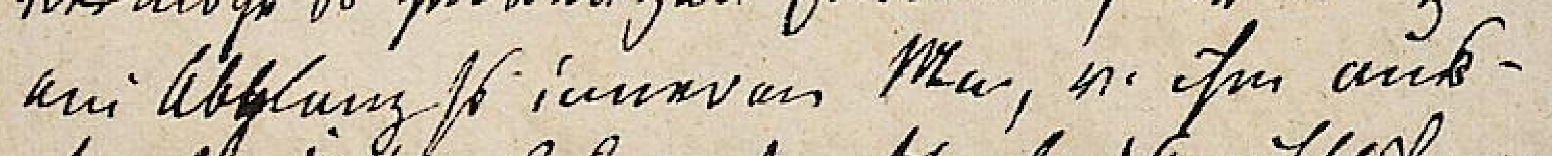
ein Abglanz ss inneren Mn, v. ihm aus¬
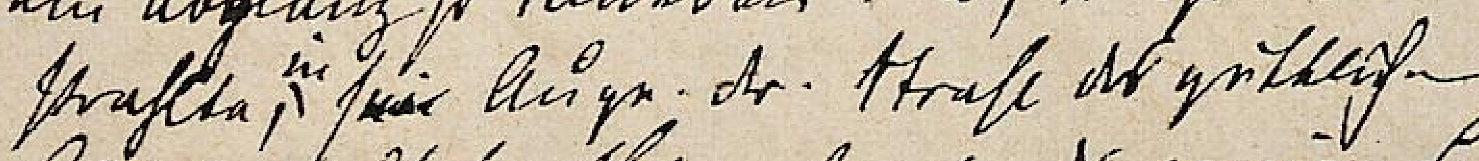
strahlte, in seine Auge dr. Strahl des geistlichen
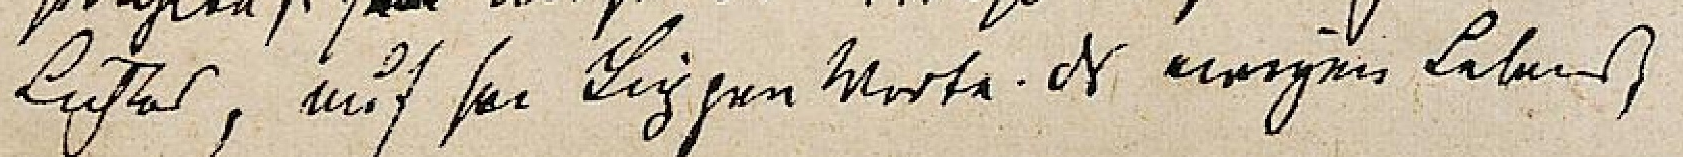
Lichtes, auf sn Lippen Worte ds ewigen Lebens,
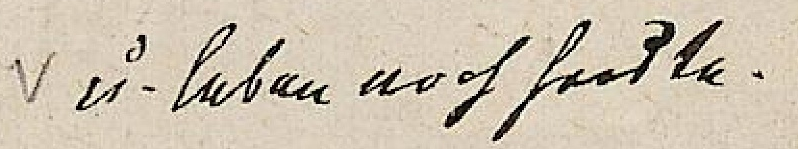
V u. leben noch heute.
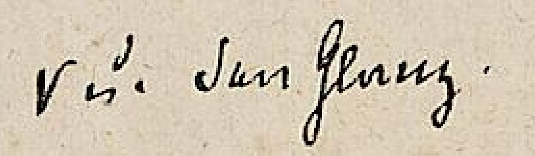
V u. den Glanz.
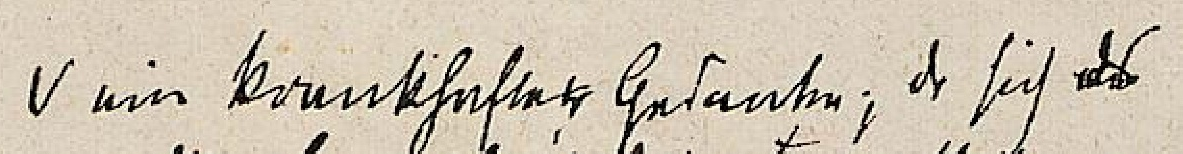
V ein krankhafter Gedanke, dr sich ds
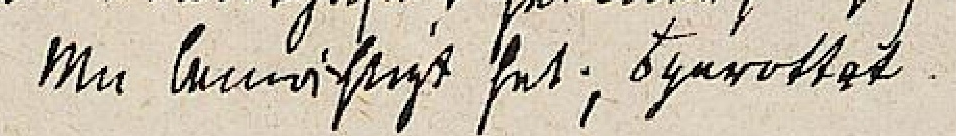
Mn bemächtigt hat; sgerottet.
